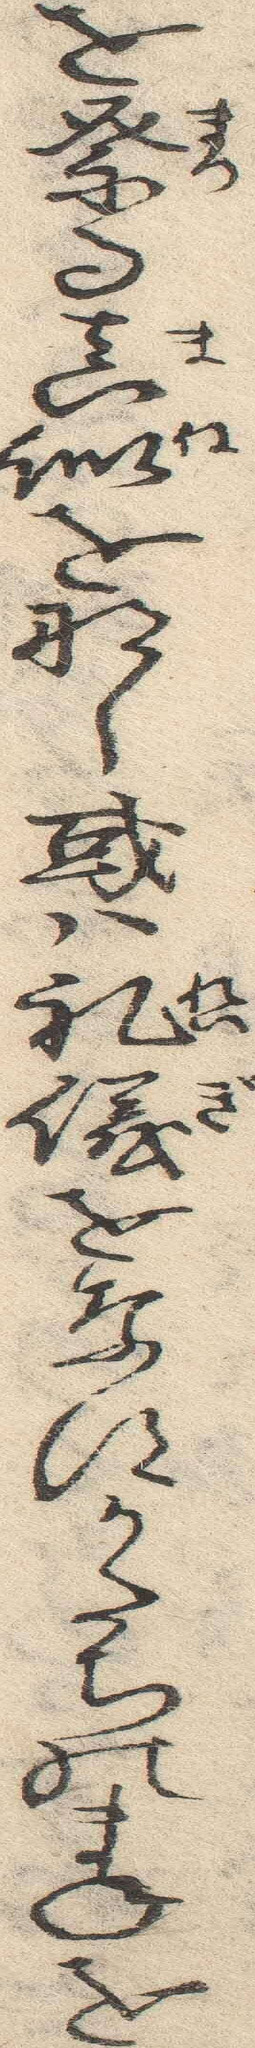を祭る真似をなし或は礼儀をなすかたちのまねを
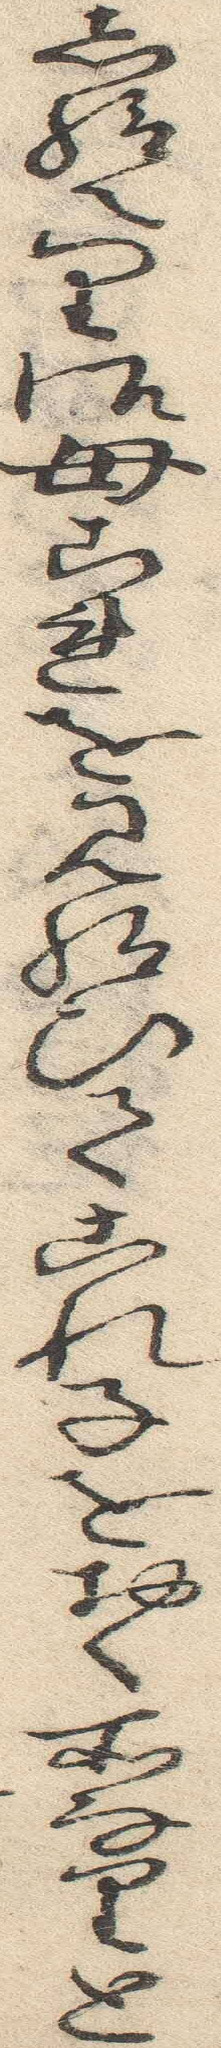し給えり御母これを見給ひてこれ子をおく所なりと
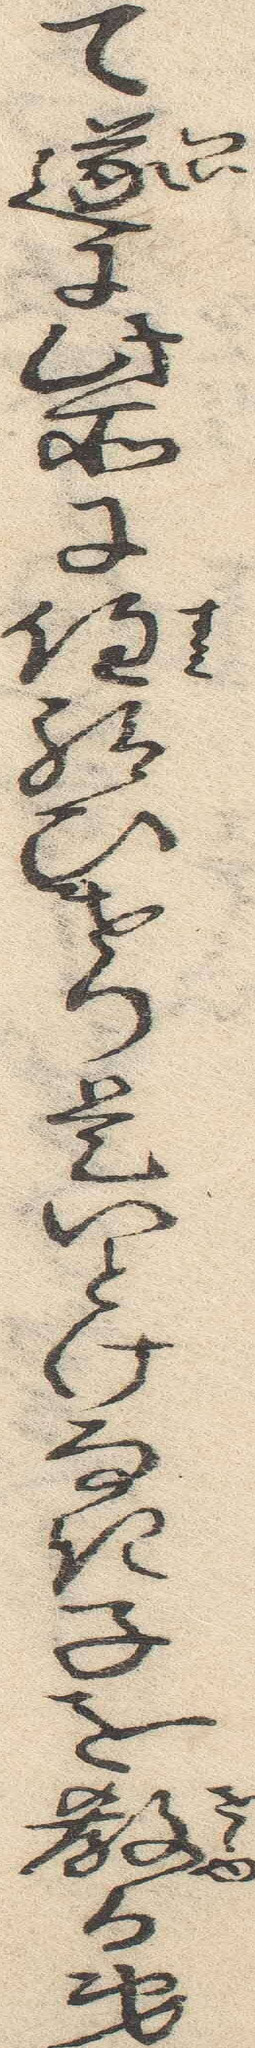て遂に此所に住給ひけり是いとけなき子を教る第
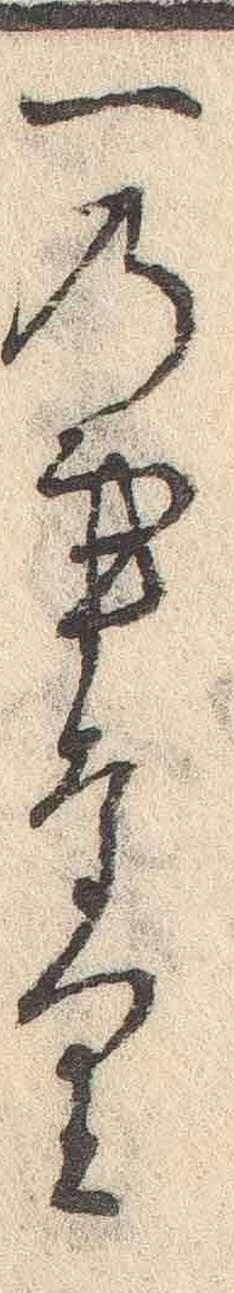一の事なり
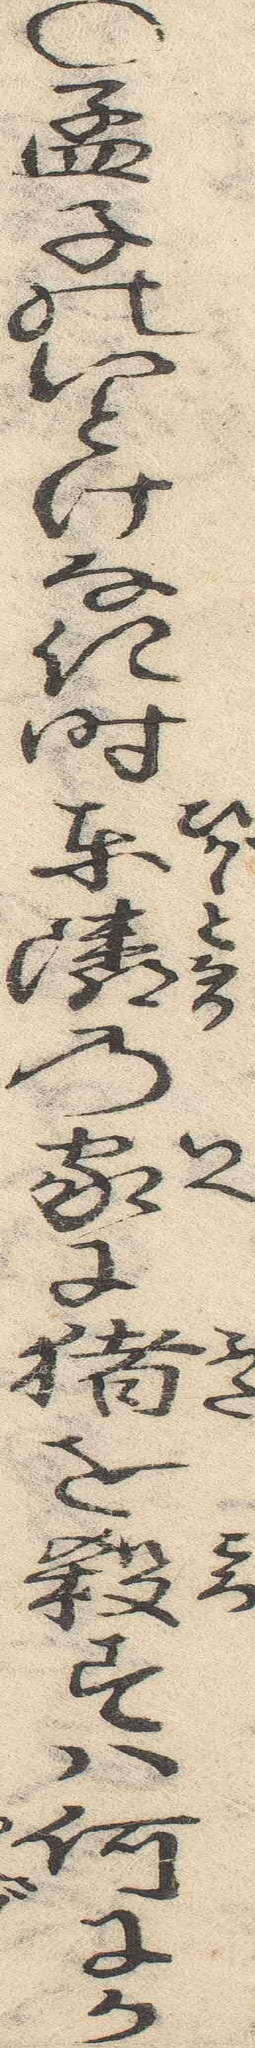○孟子のいとけなき時東隣の家に猪を殺すは何にか
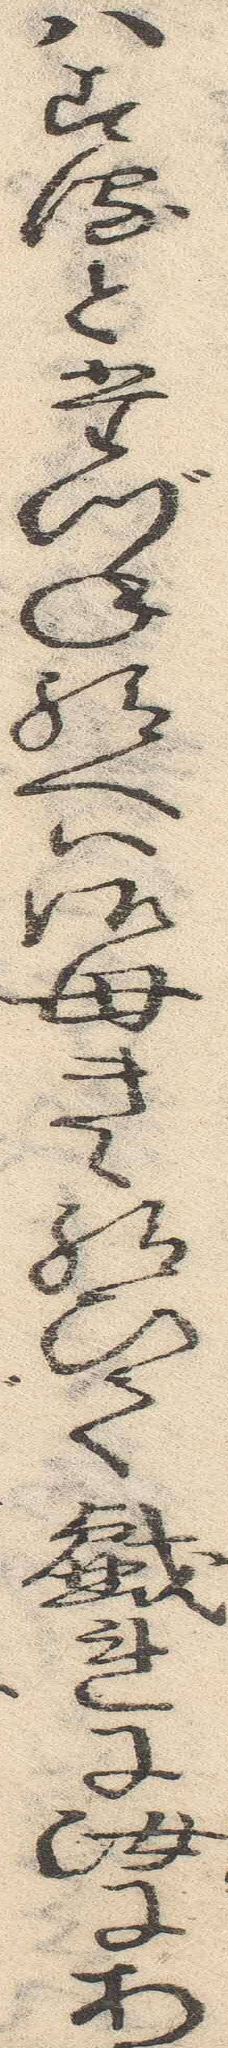はするとたづね給へは御母きゝ給ひて戯れに汝にあ
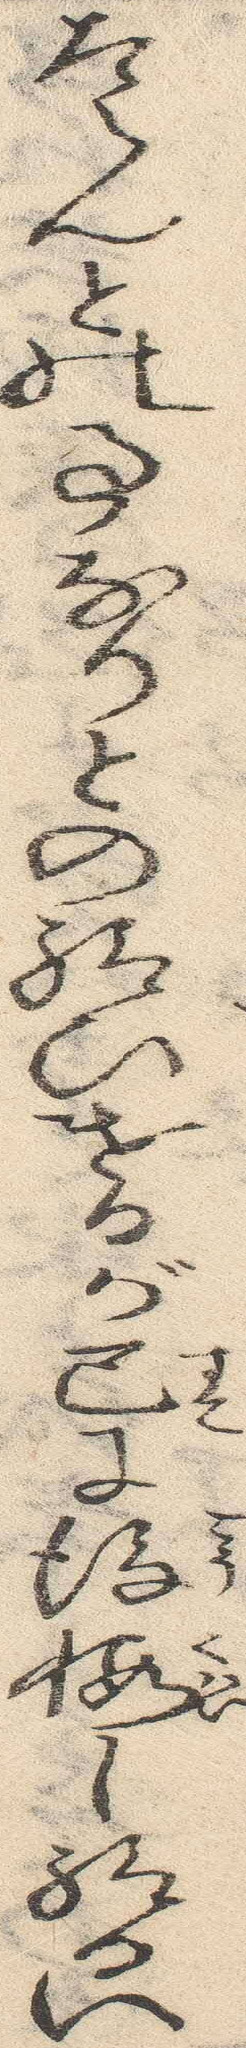たえんとの事なりとの給ひけるが已に後悔し給るい
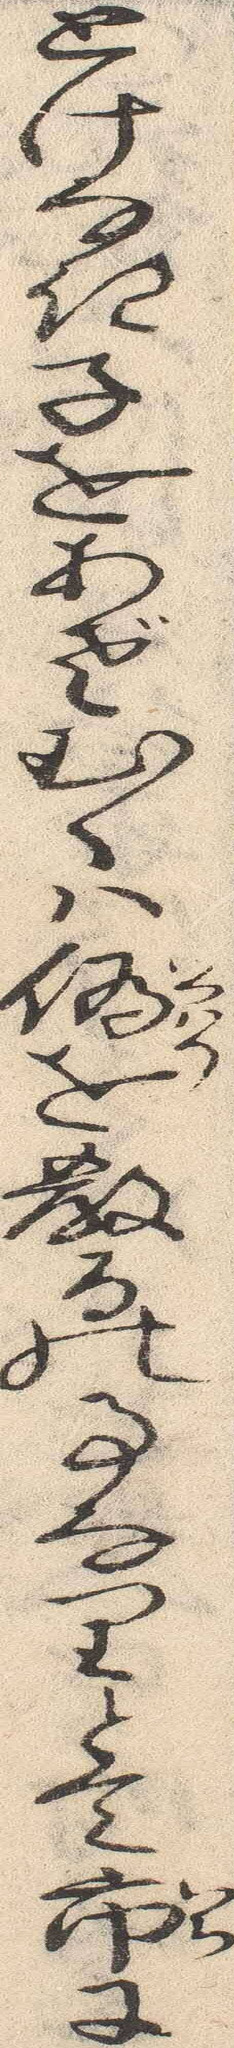とけなき子をあざむくは偽を教るの事なりとて市に
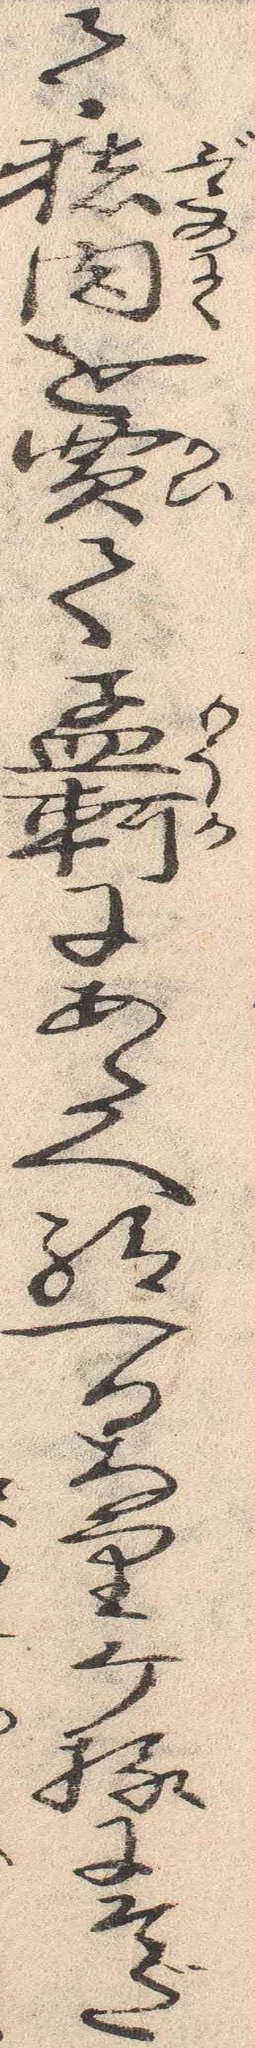て猪肉を買て孟軻にあたへ給へるなりケ様にそだ
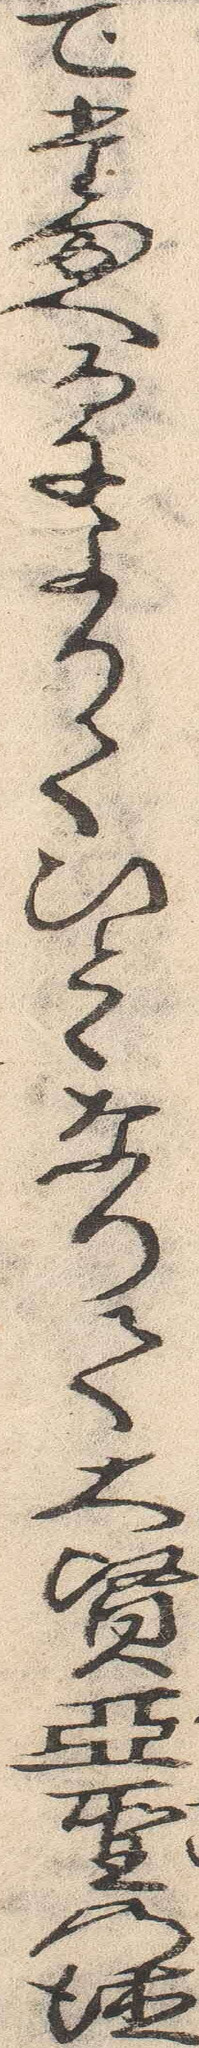てたまへるによりてひとゝなりて大賢亜聖の徳
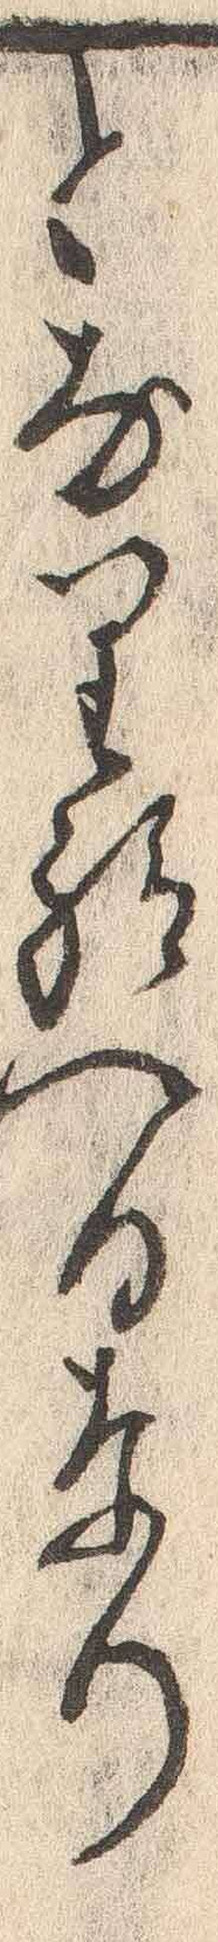となり給へるなり
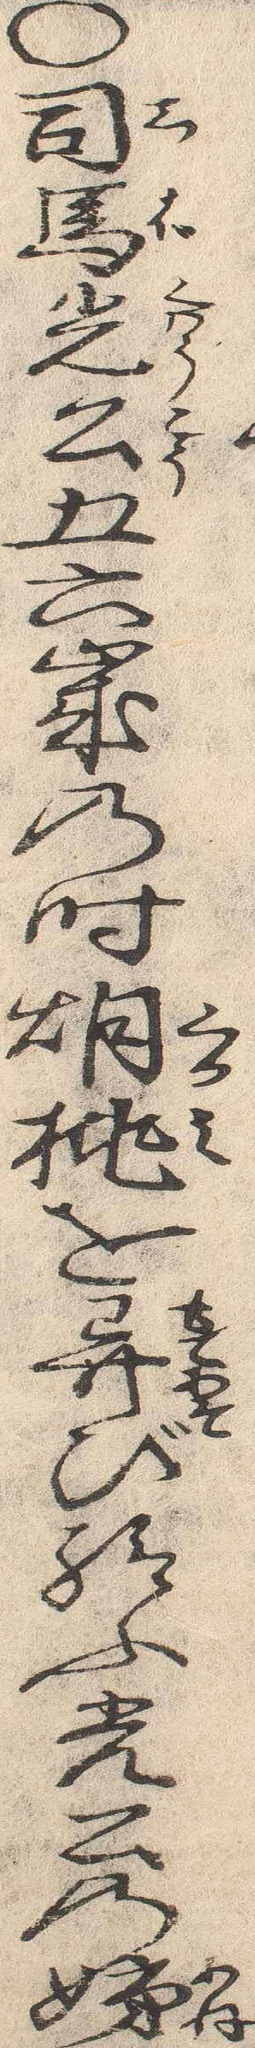○司馬光公五六歳の時胡桃を弄び給ふ光公の姉
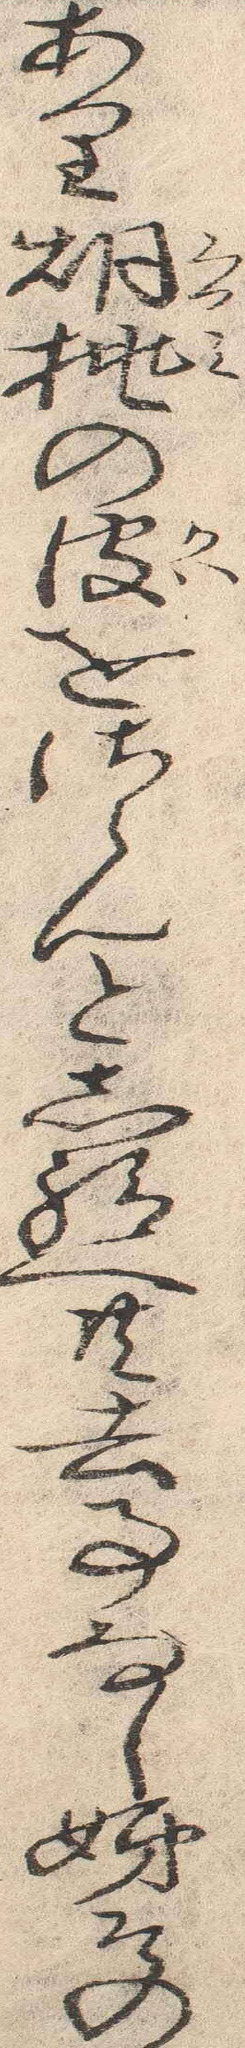あり胡桃の皮をさらんとし給へ共去事なし姉その
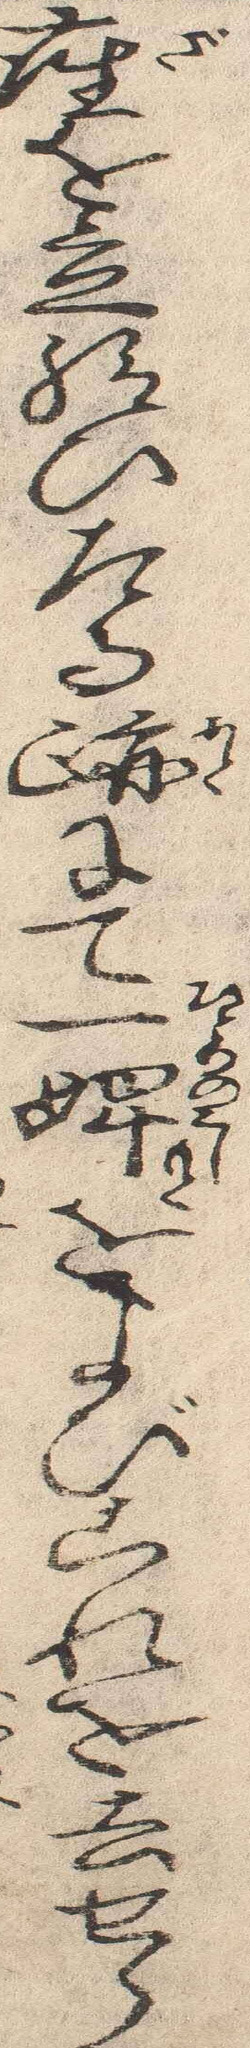座を立給ひたる跡にて一婢をよびこれを去せら
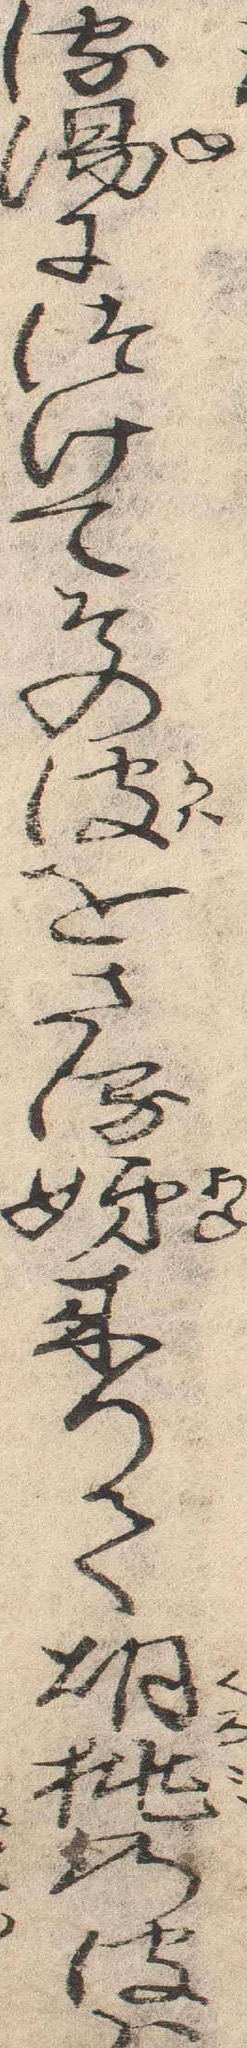る湯につけてその皮をさる姉来りて胡桃の皮は
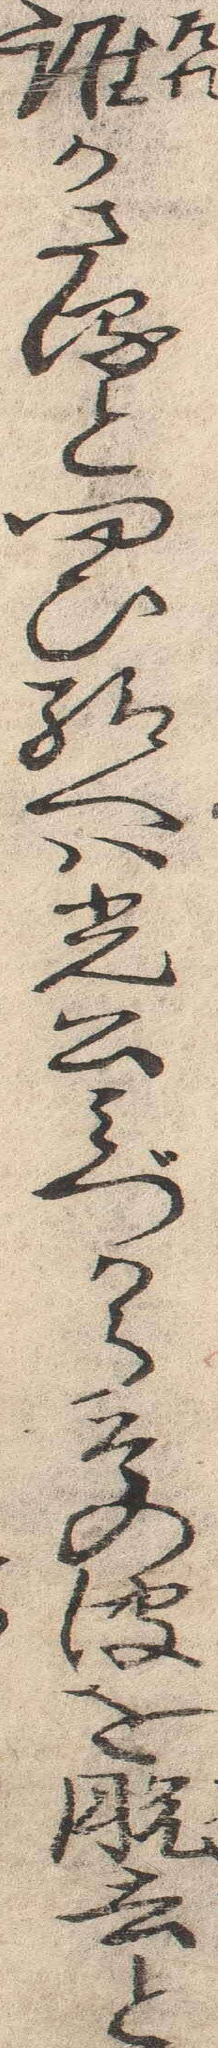誰かさると問ひ給へは光公みづからその皮を脱去と
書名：小児必用養育草
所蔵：東京学芸大学附属図書館 国文学研究資料館
